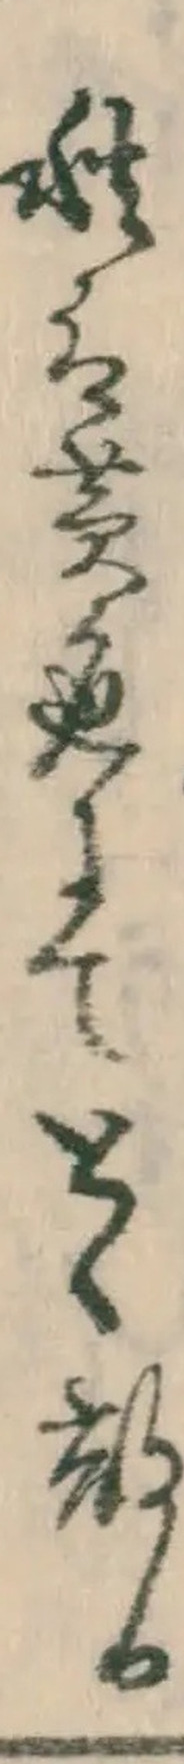秋は黄色にてとく散る
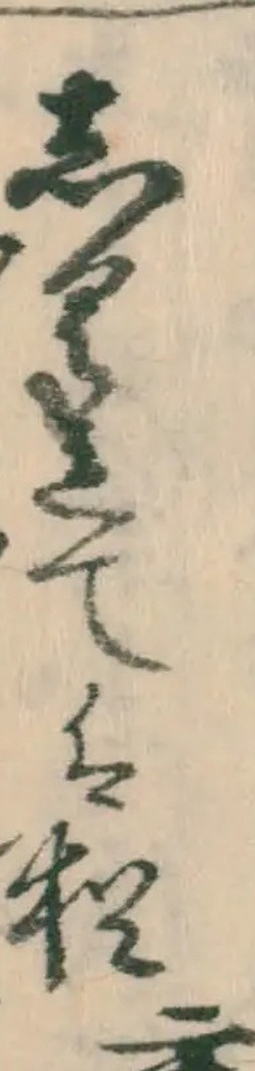しくれては猶
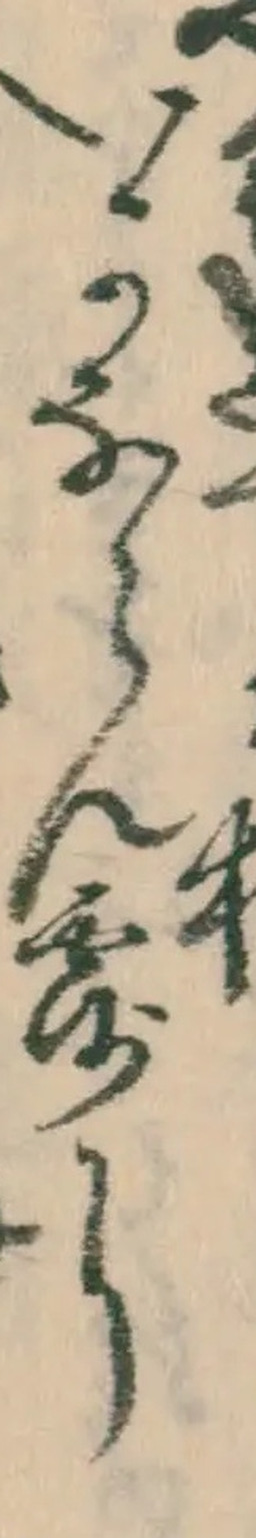いかならん露に
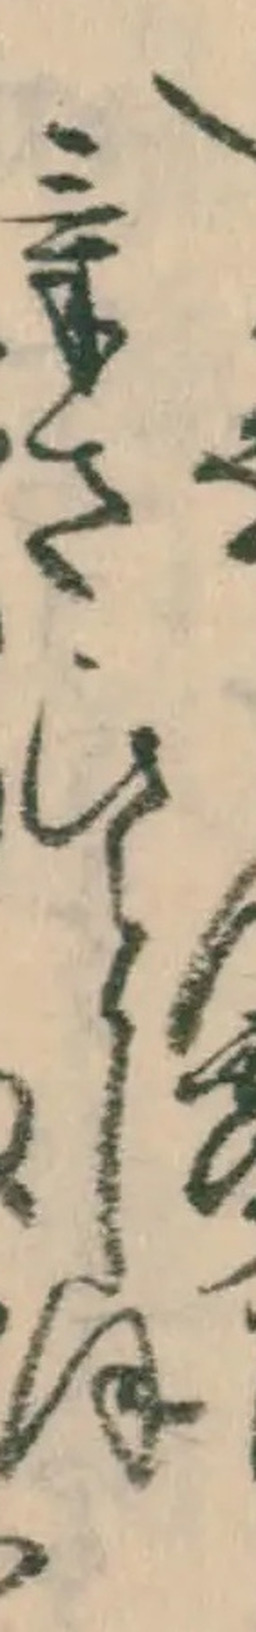けさひとしほ
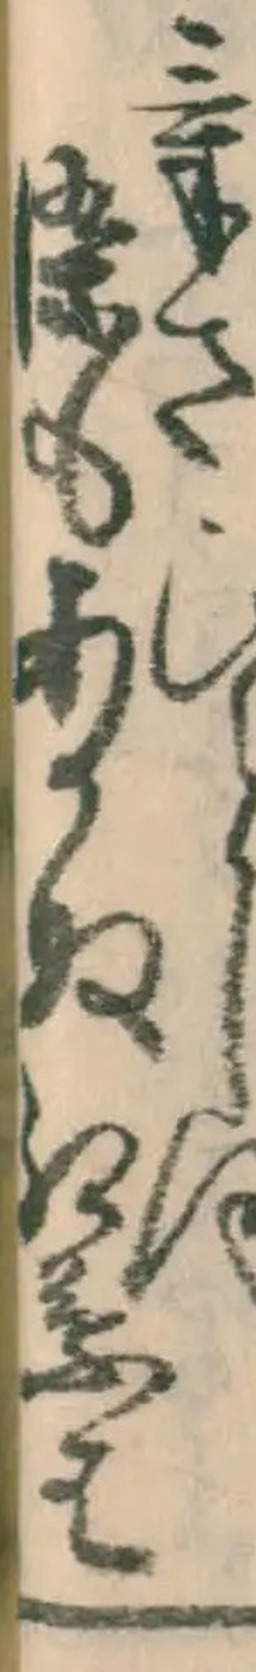染もあかぬ紅葉は
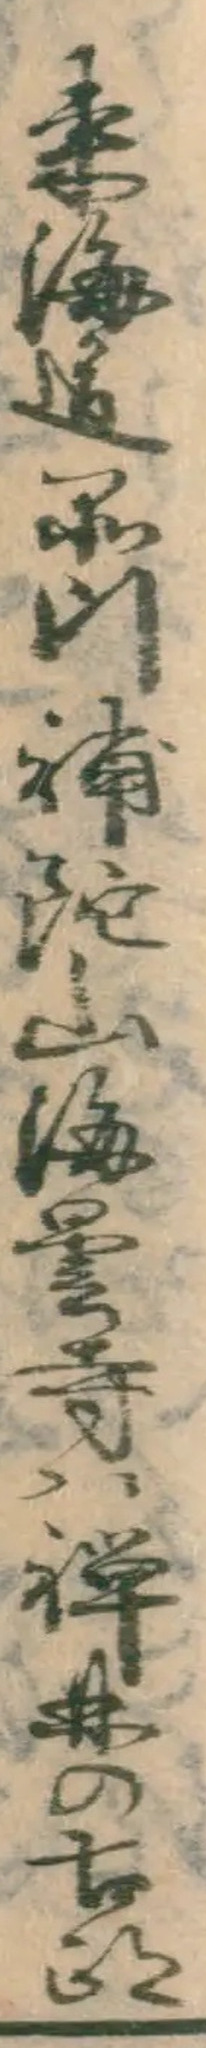品川東海道品川補陀山海曇寺は禅林の古跡
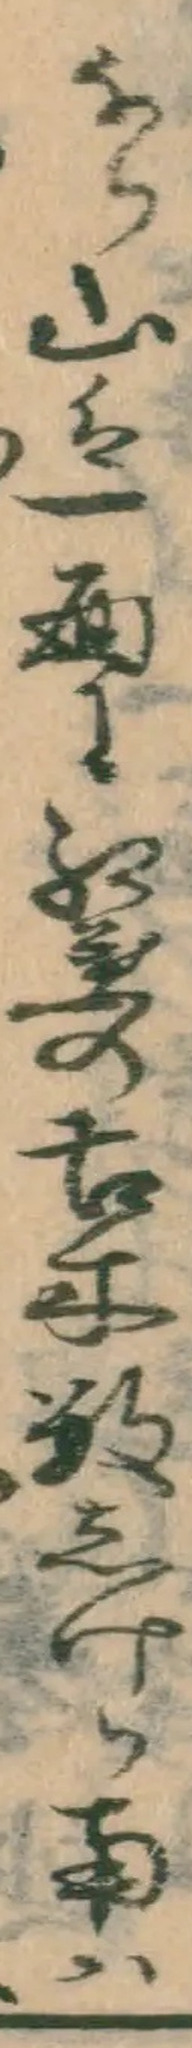なり山は一面に紅葉の古木数しけり南は
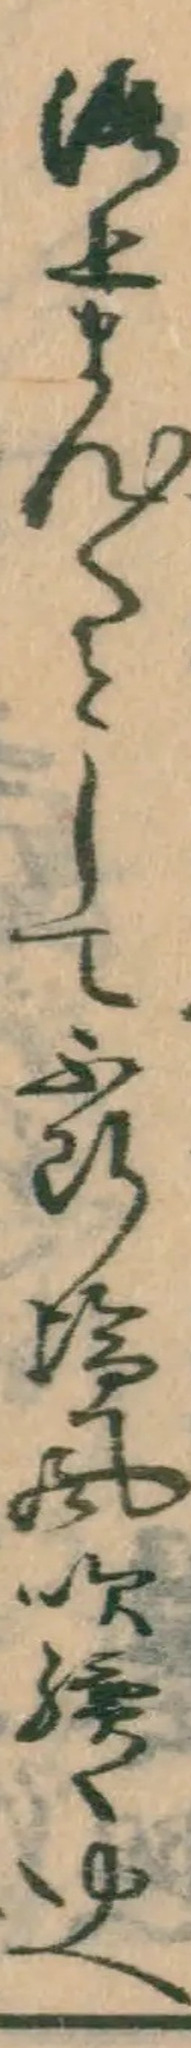海上まん〳〵として不断塩風吹続くゆへ
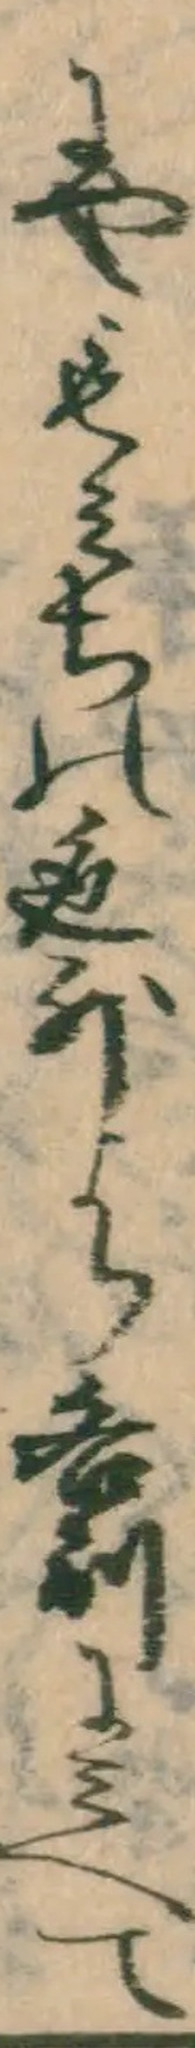にやもみちの色外より各別にみへて
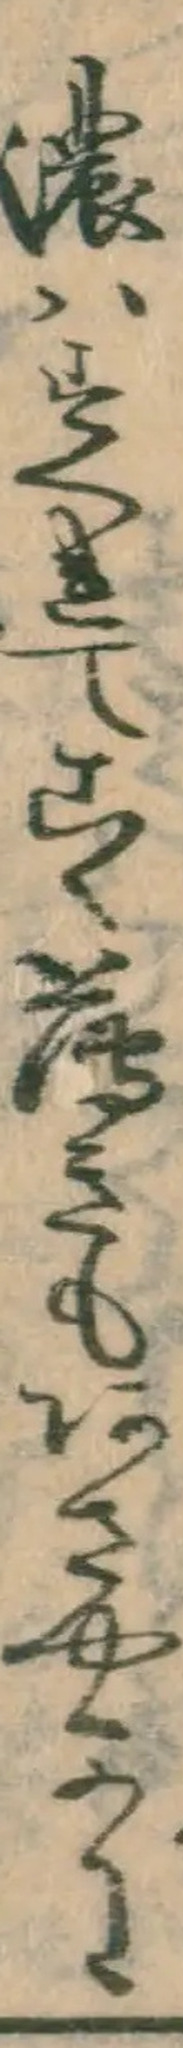濃はすくれてこく薄きもあさやかに
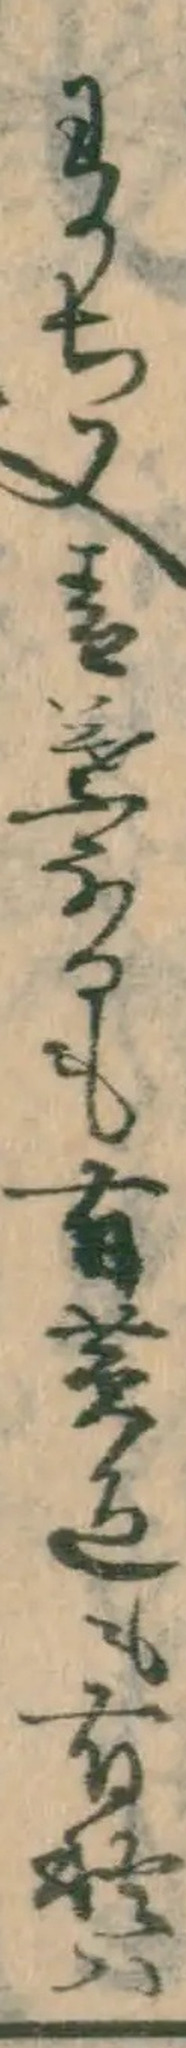わかち又青葉なるも有黄色も有秋は
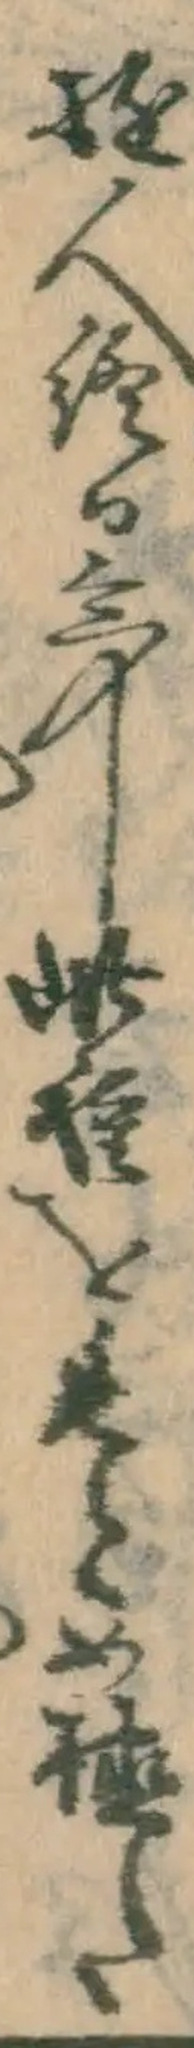遊人終日多し此種をもとめ植た
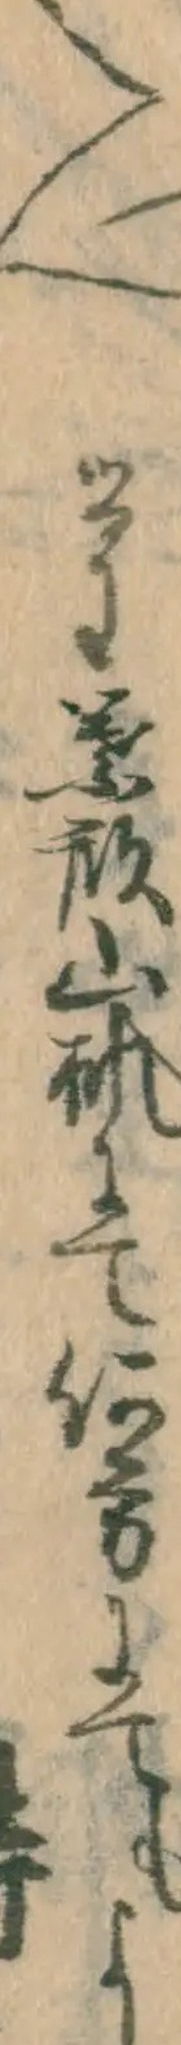るに葉形山楓にて何方にてもよし
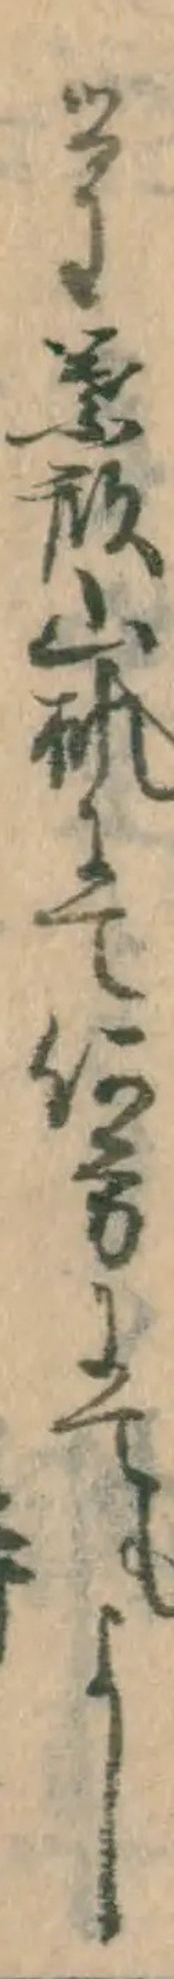るに葉形山楓にて何方にてもよし
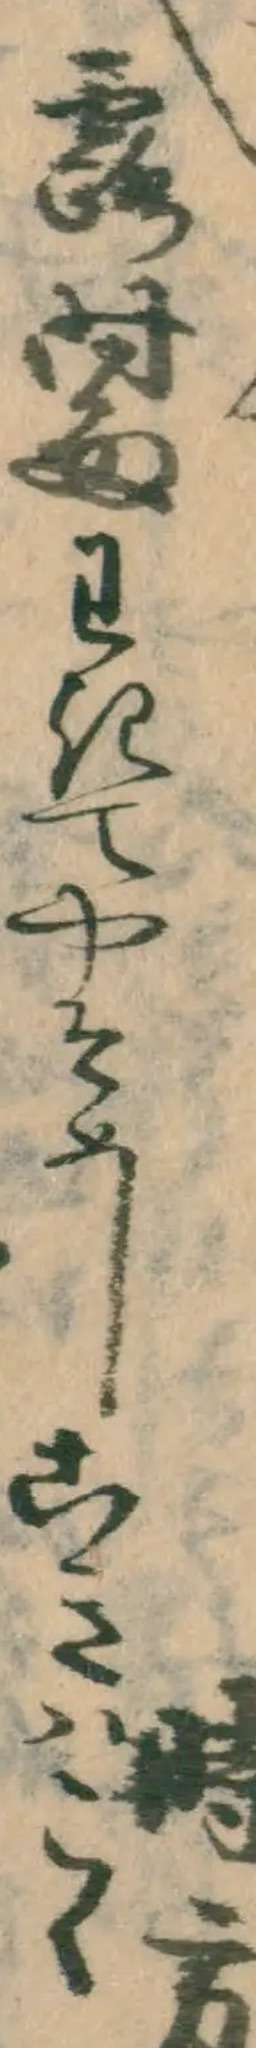露時雨わきてやそめしこきはこく
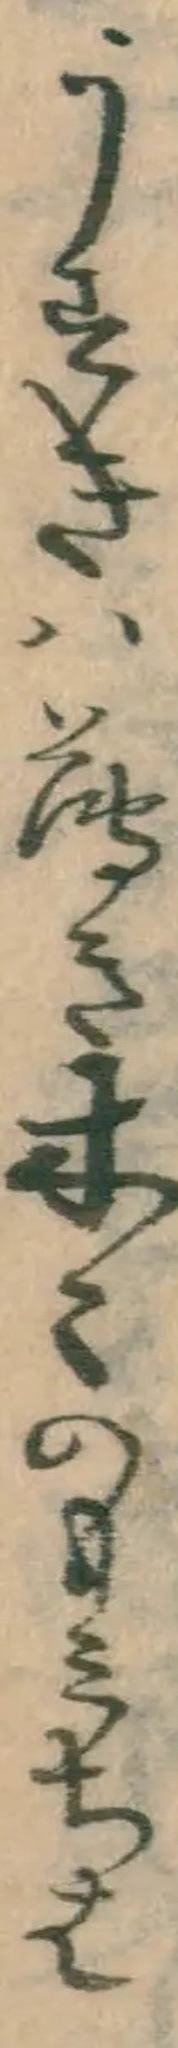うすきは薄き木々のもみちは
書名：紅葉集
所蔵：国立国会図書館 National Diet Library, JAPAN
